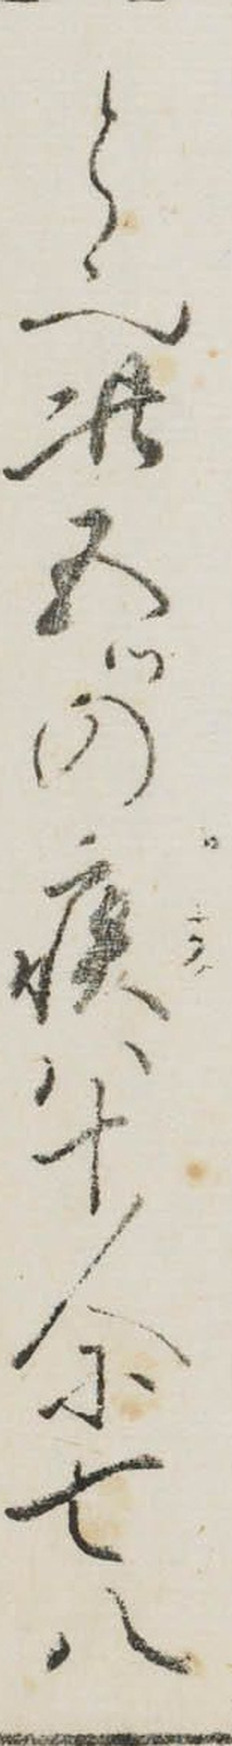と也此五の疾は十人に七ハ

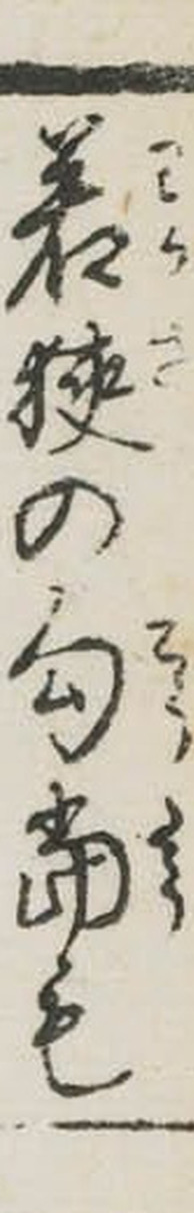若狭の勾当も
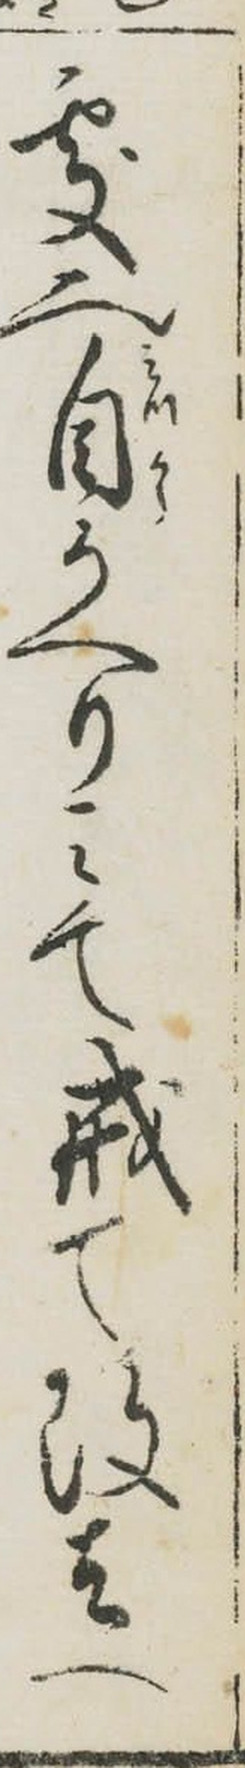處也自かへりみて戒て改去へ
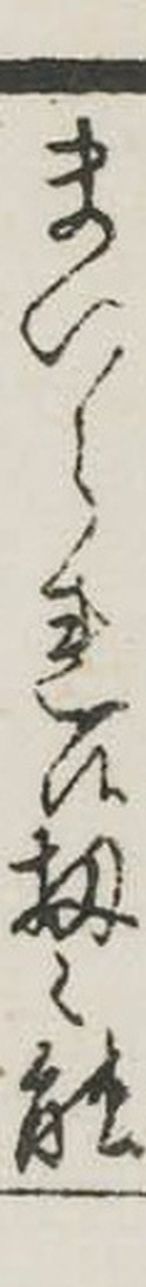まいられ候扨々能
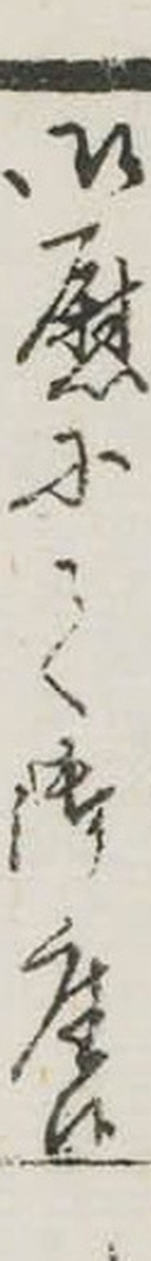御慰にて御座候
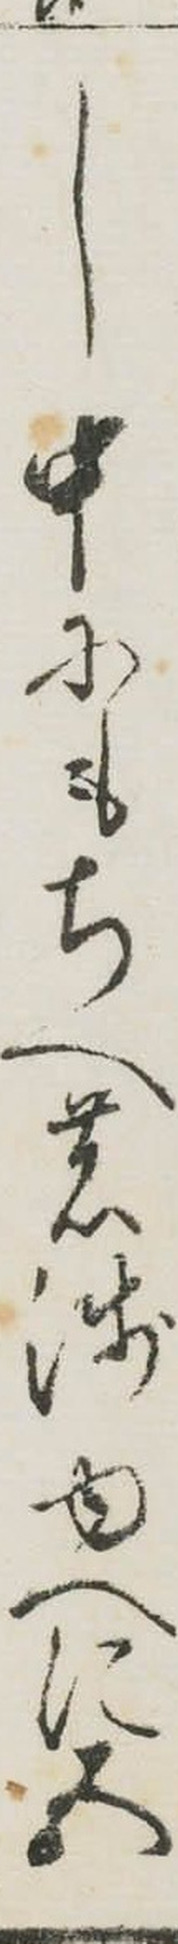し中にもちへの浅ゆへに五
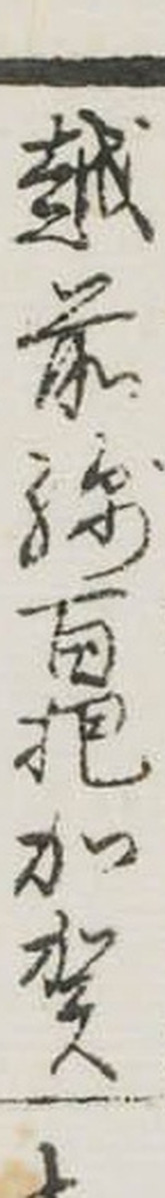越前綿百把加賀
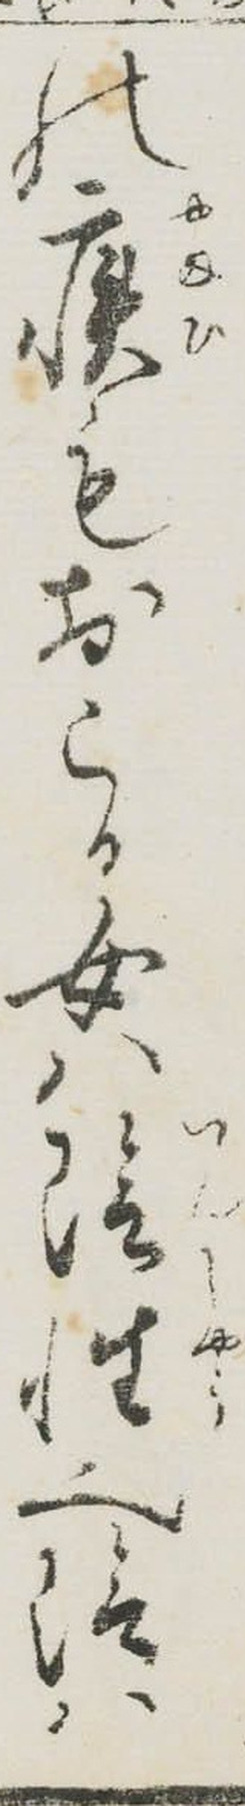の疾もおこる女は陰性也陰は
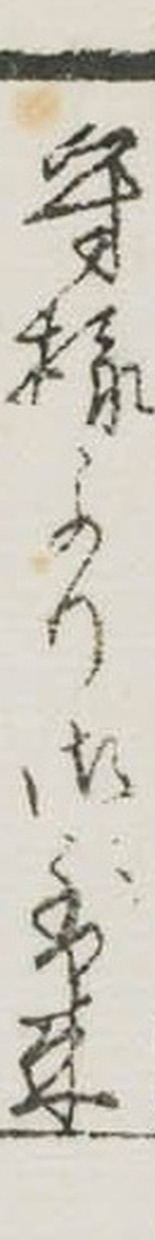守様より御到来
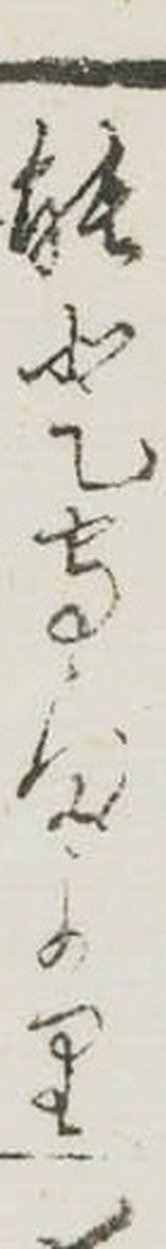能登守さまより
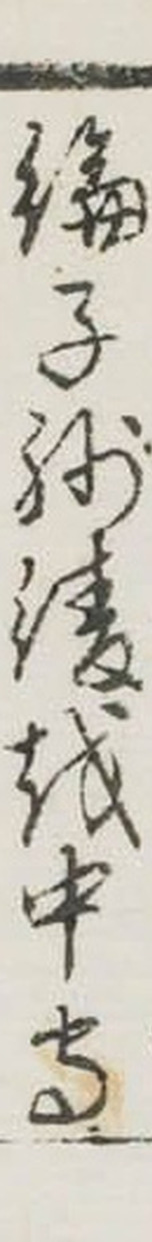綸子紗綾越中守
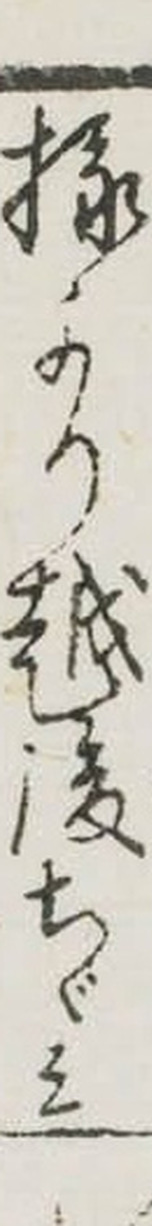様より越後ちゞみ
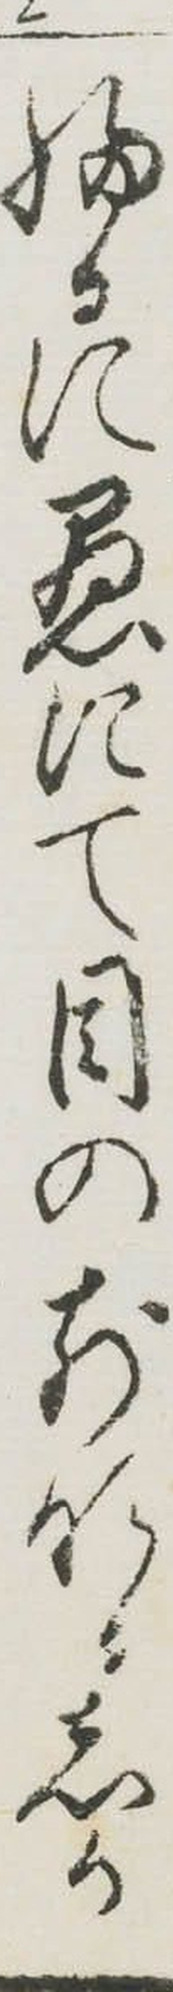ふるに愚にて目の前なるしか
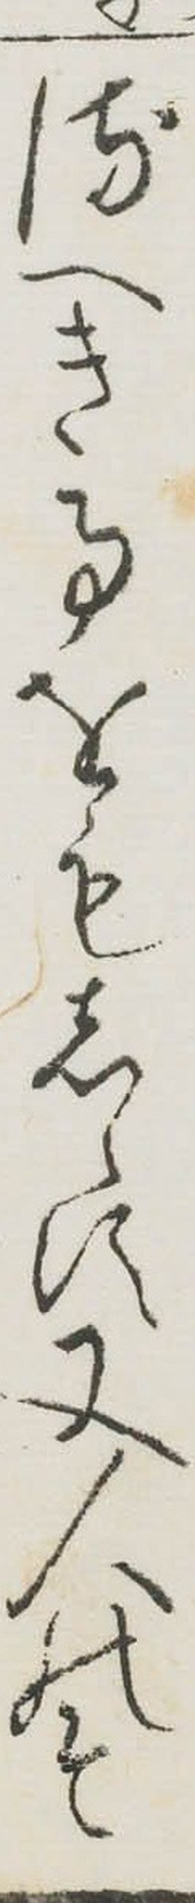るへき事をもしらす又人のそ
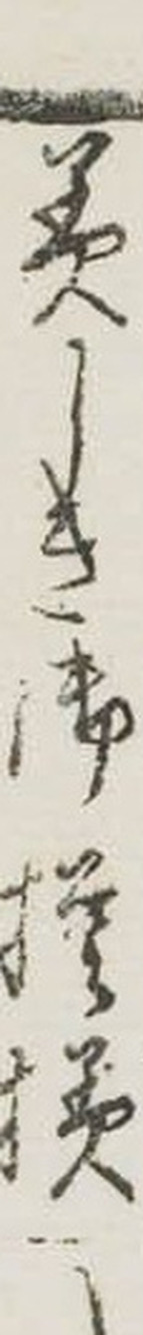美しき御模様
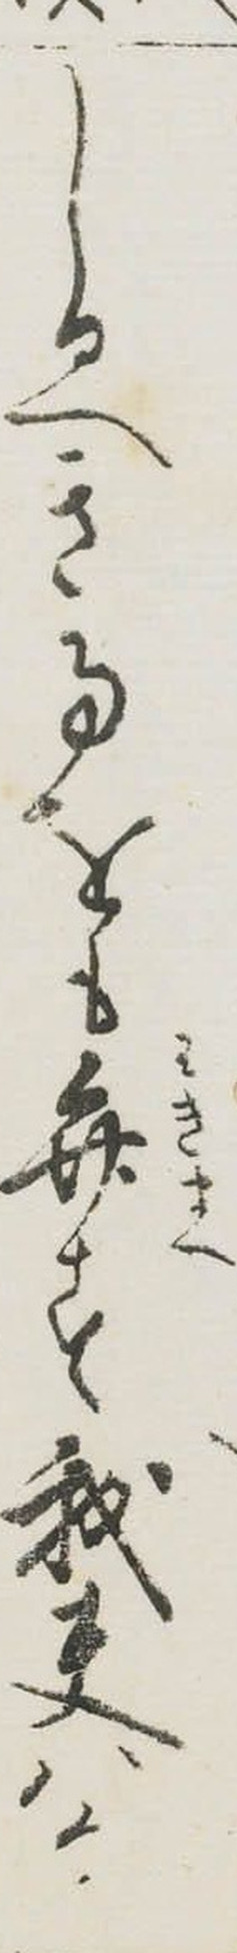しるへき事をも弁す我夫はか
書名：女大学
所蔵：東京学芸大学教育コンテンツアーカイブ
